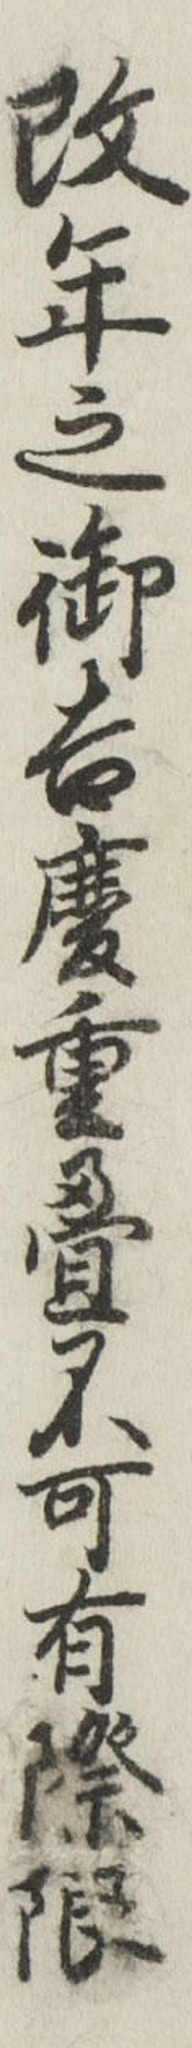改年之御吉慶重畳不可有際限
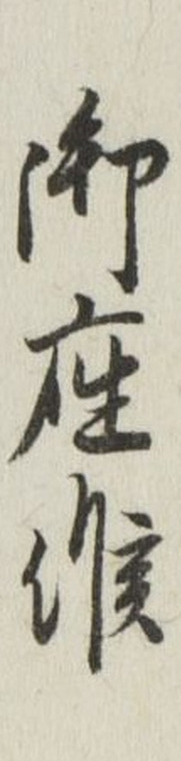御座候
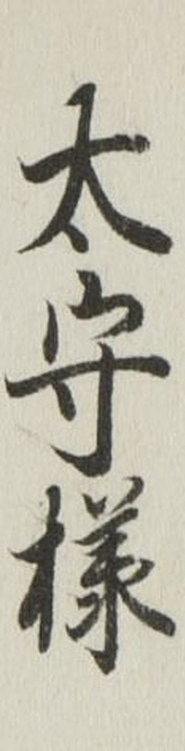太守様
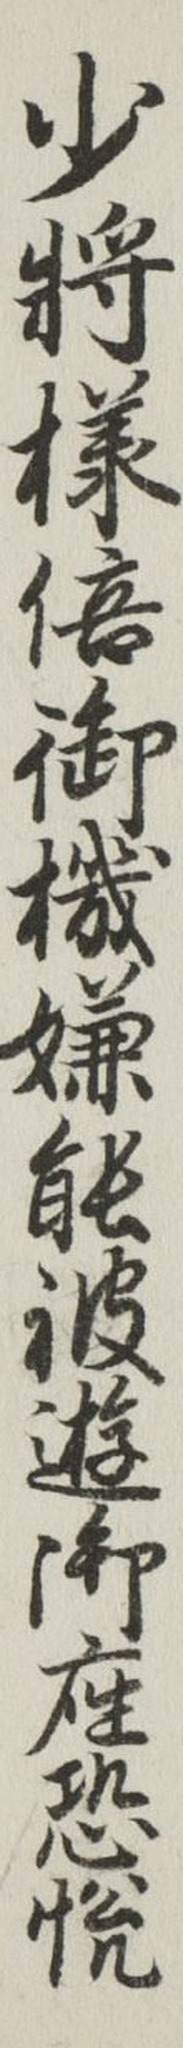少将様倍御機嫌能被遊御座恐悦
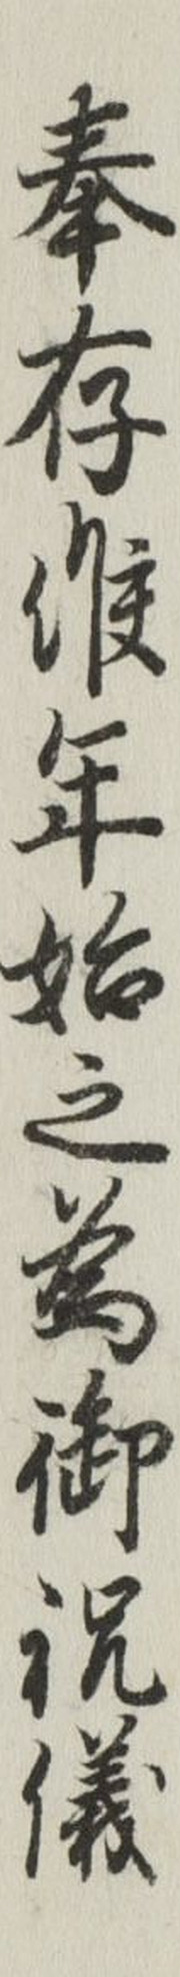奉存候年始之為御祝儀
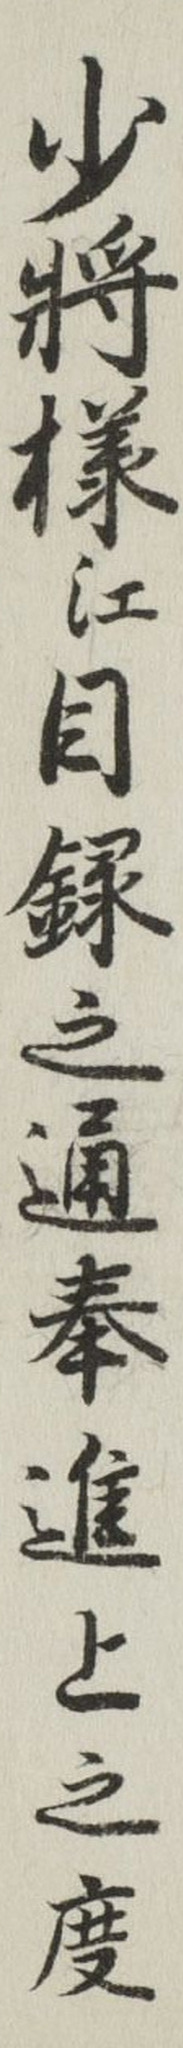少将様江目録之通奉進上之度
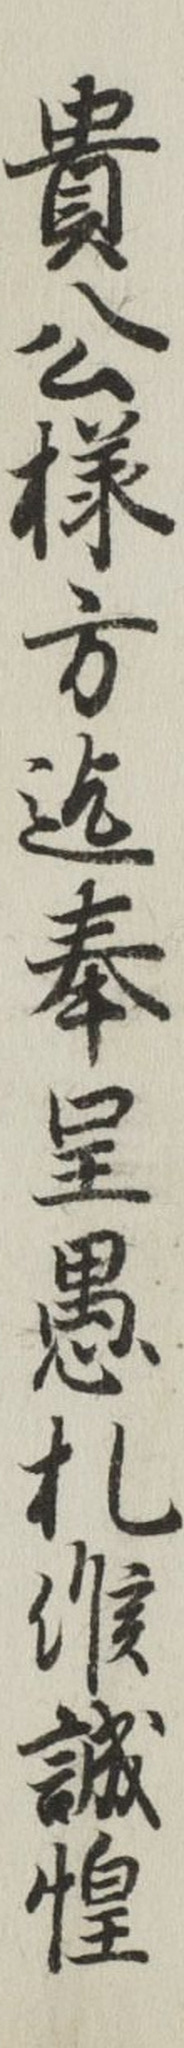貴公様方迄奉呈愚札候誠惶
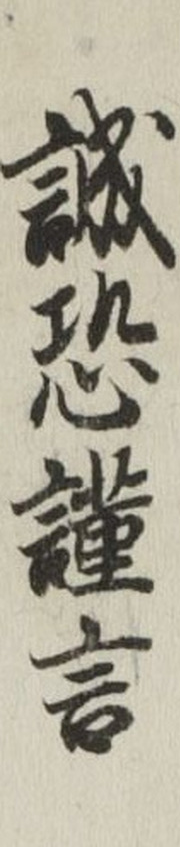誠恐謹言
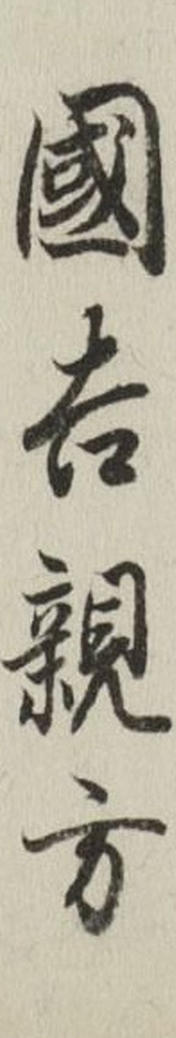国吉親方
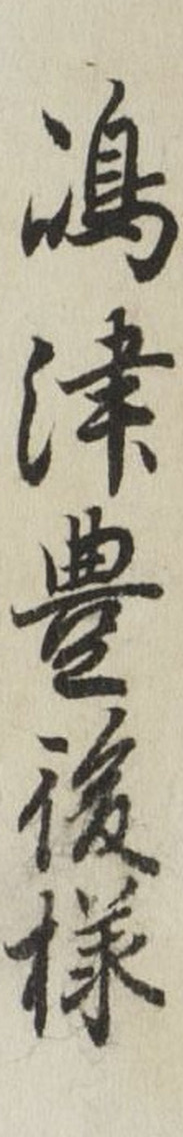嶋津豊後様
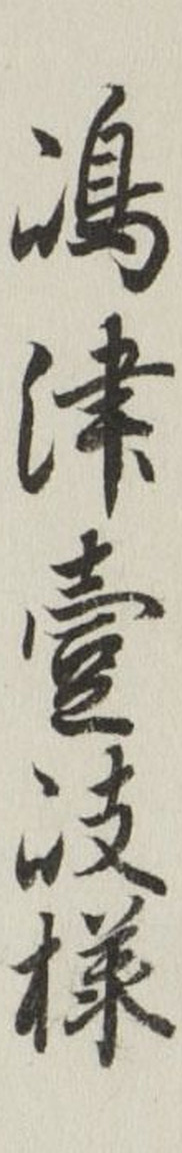嶋津壱岐様
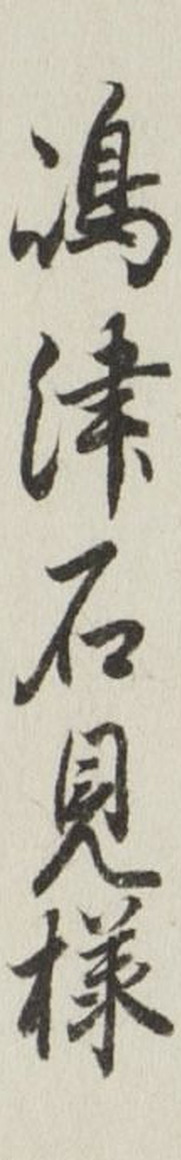嶋津石見様
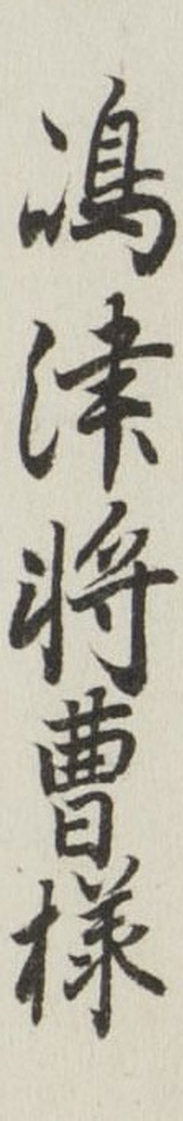嶋津将曹様
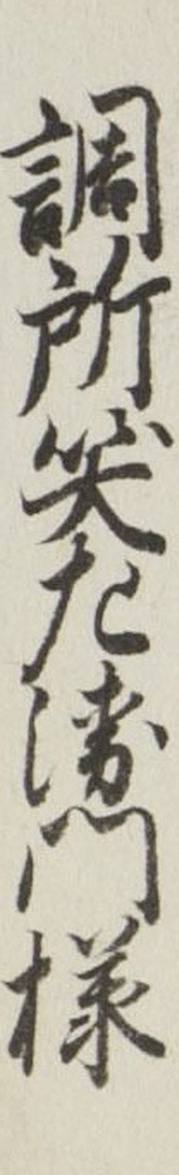調所笑左衛門様
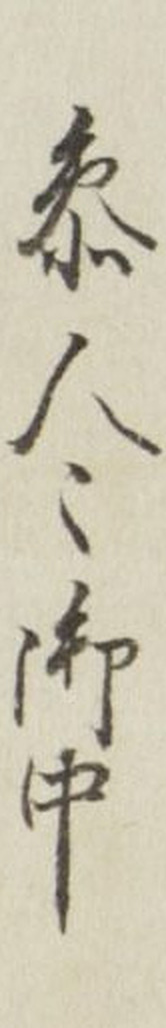参人々御中
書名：島津家宛花押印状(二) 国吉親方 朝章
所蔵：University of the Ryukyus Library
